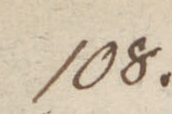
108.
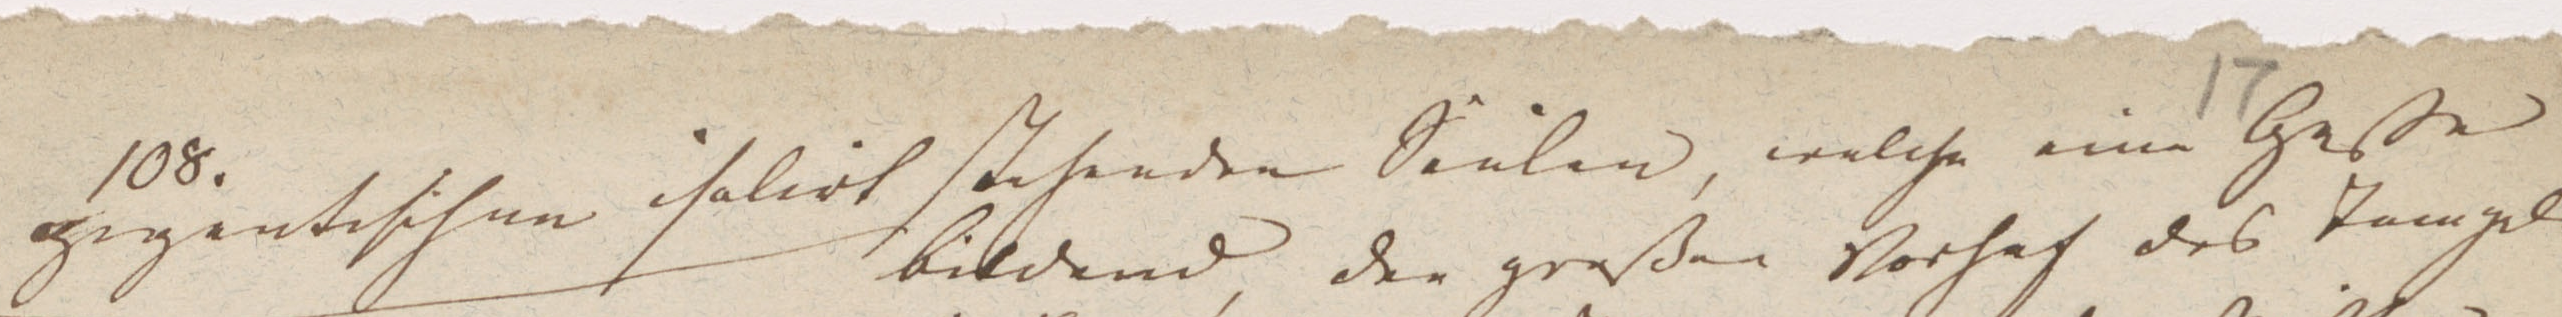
%gigantischen isolirt %stehenden Säulen, welche eine Gasse
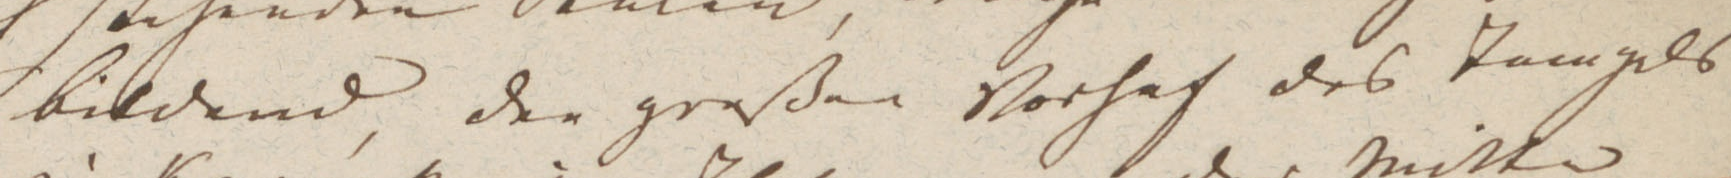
bildend, den grossen Vorhof des Tempels
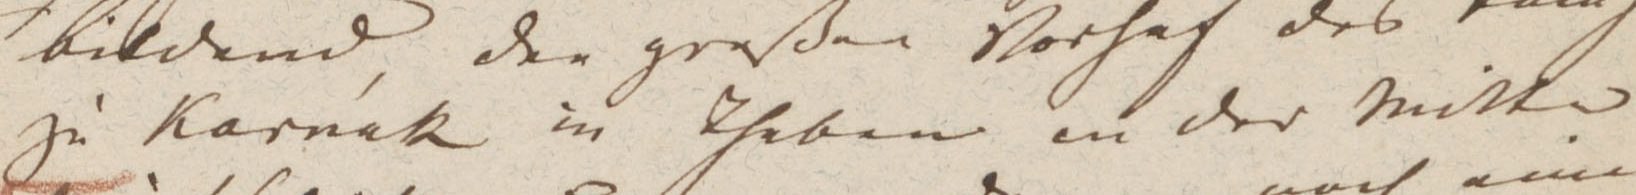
zu Karnak in Theben in der Mitte
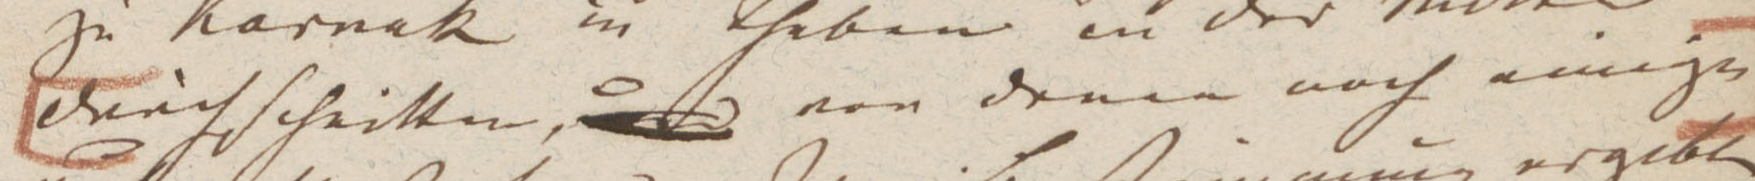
%durchschnitten, und von denen noch einige%
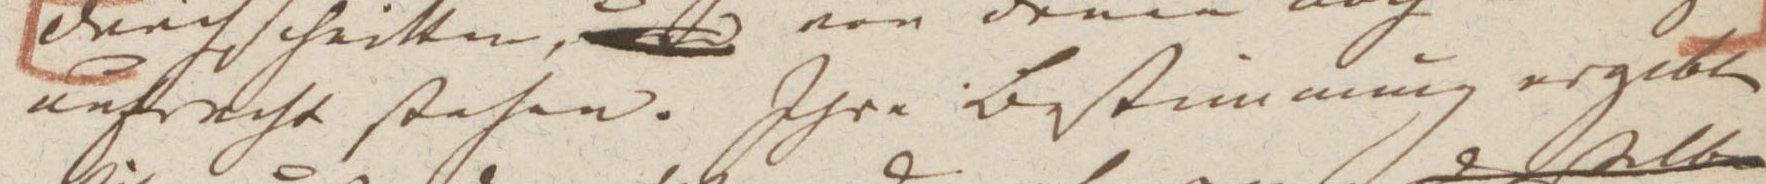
aufrecht stehen. Ihre Bestimmung ergibt
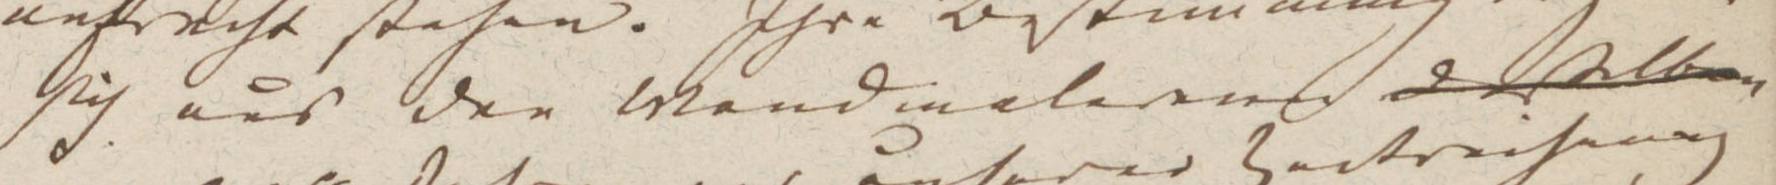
sich aus den Wandmalereien desselben
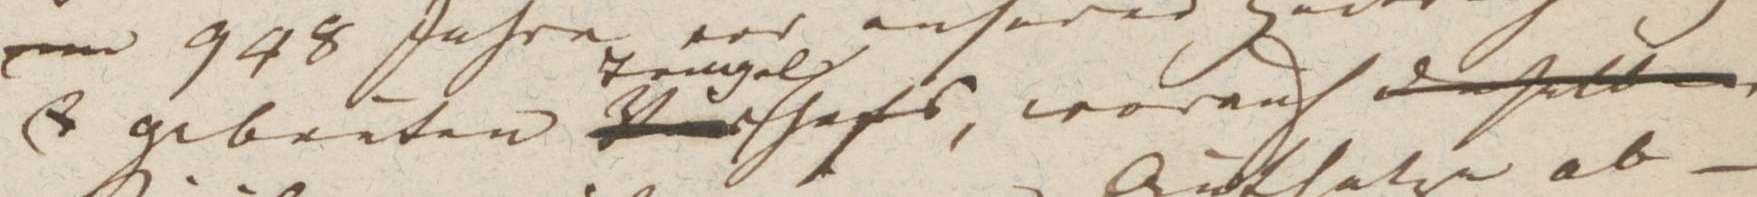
gebauten VorTempelhofs, worauf dselben
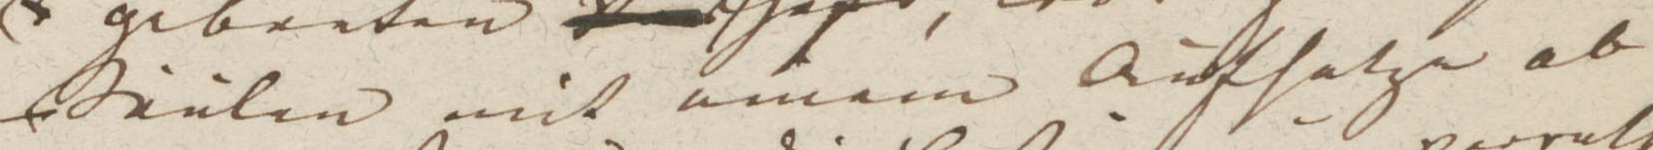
Säulen mit einem Aufsatze ab-
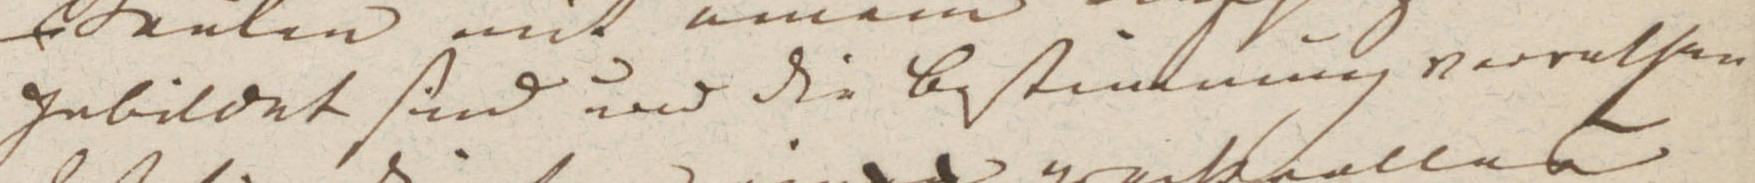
gebildet sind und die Bestimmung verrathen
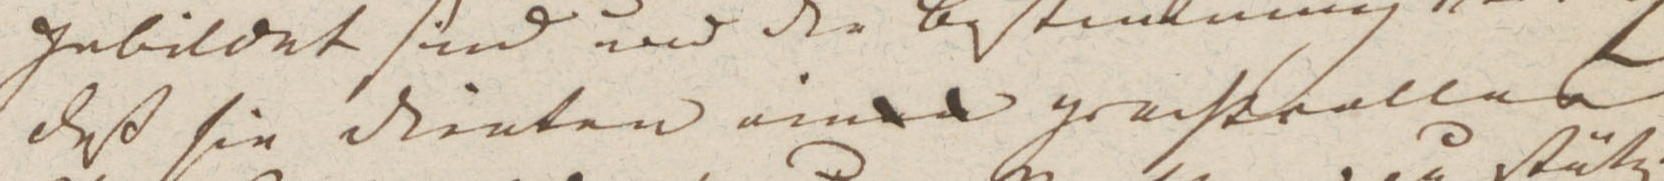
dass sie dienten einen prachtvollens
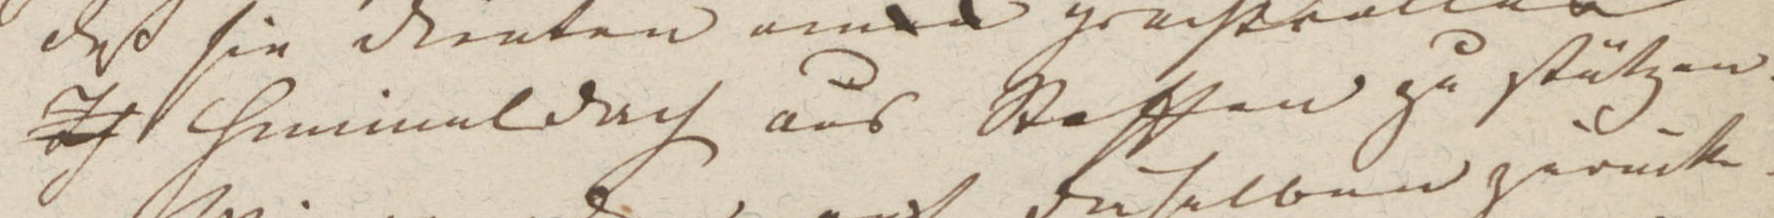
Th Himmeldach aus Stoffen zu stützen.
